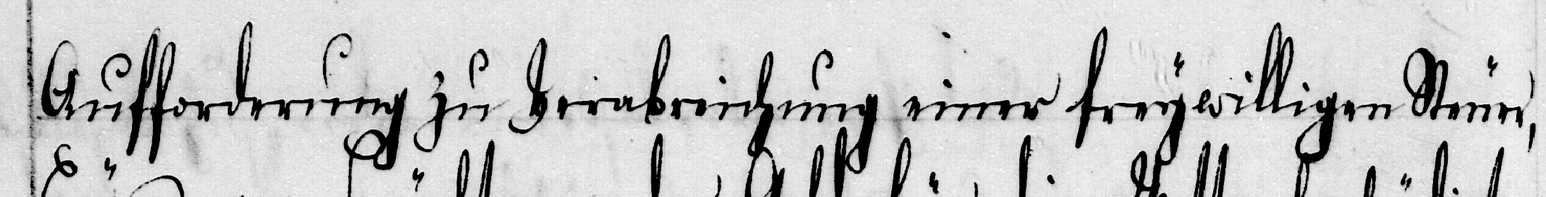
Aufforderung zu Verabreichung einer freywilligen Steue¬
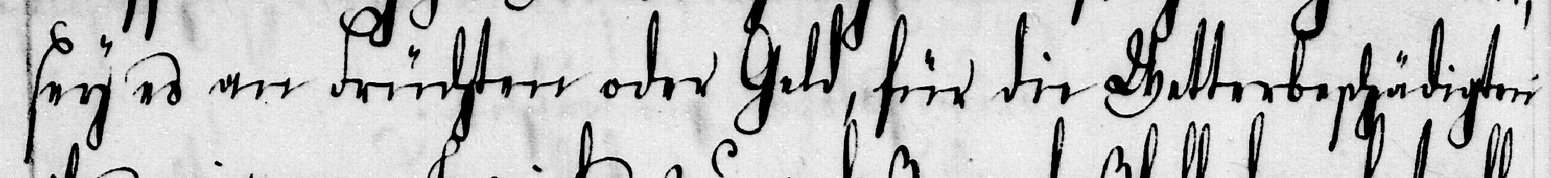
sey es an Früchten oder Geld, für die Wetterbeschädigten
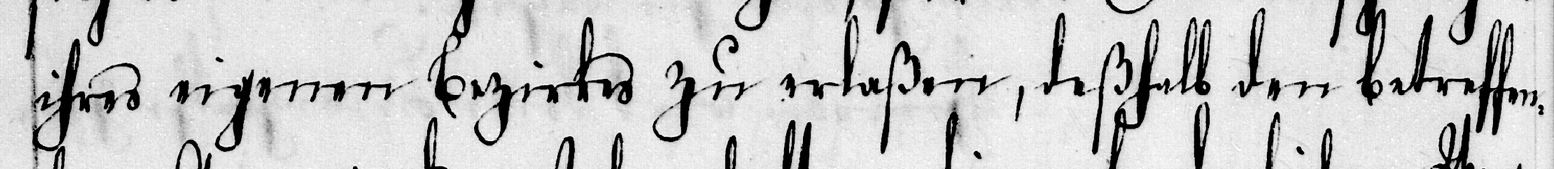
ihres eigenen Bezirkes zu erlaßen, deßhalb den betreffe¬
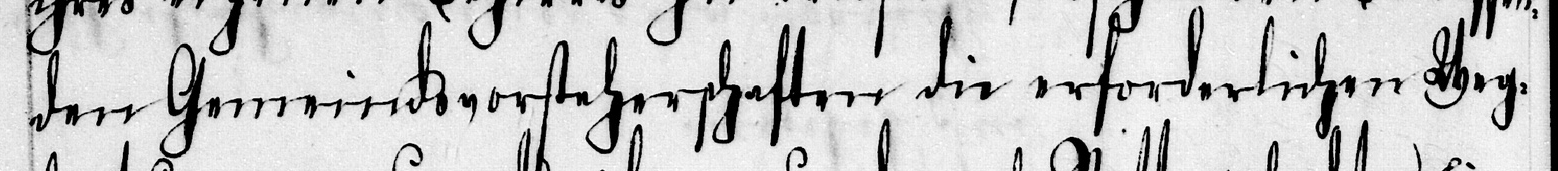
nden Gemeindsvorsteherschaften die erforderlichen Weg¬
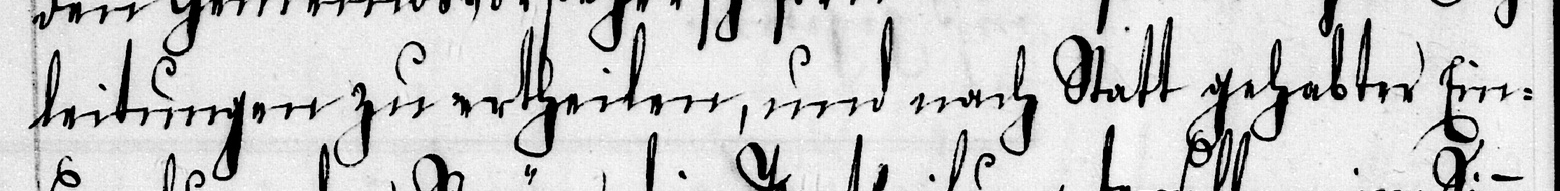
leitungen zu ertheilen, und nach Statt gehabter Ein¬
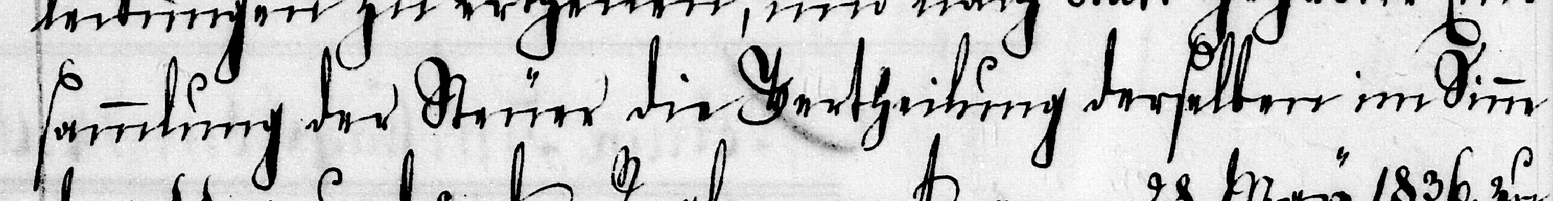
sammlung der Steuer die Vertheilung derselben im Sin¬
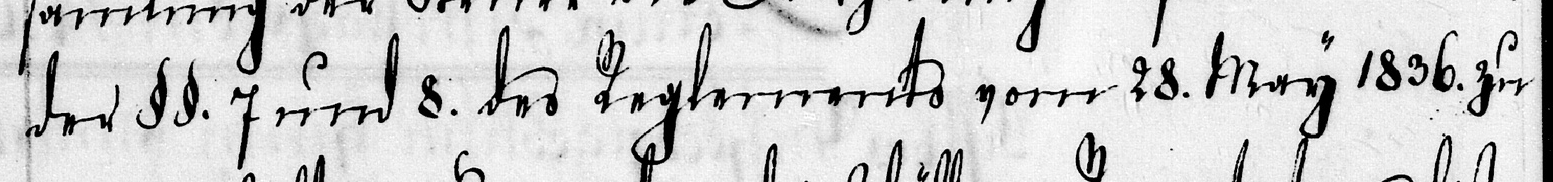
der §§. 7 und 8. des Reglements vom 28. May 1836. zu
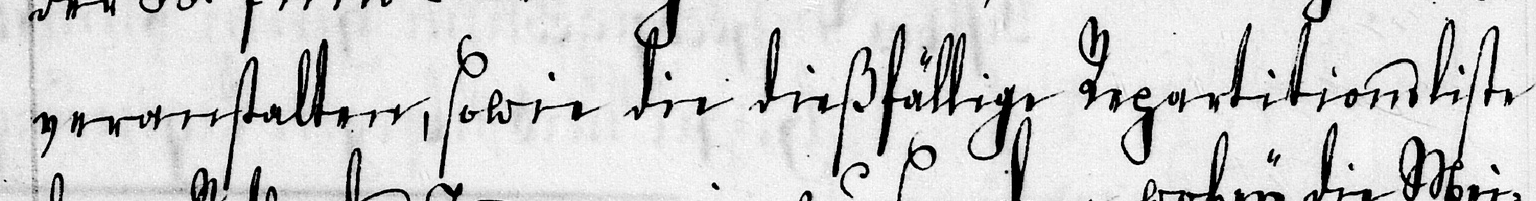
veranstalten, sowie die dießfällige Repartitionsliste
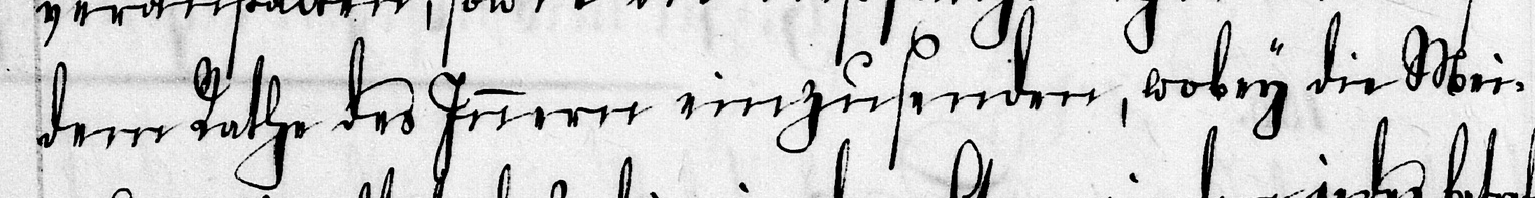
dem Rathe des Innern einzusenden, wobey die Mei¬
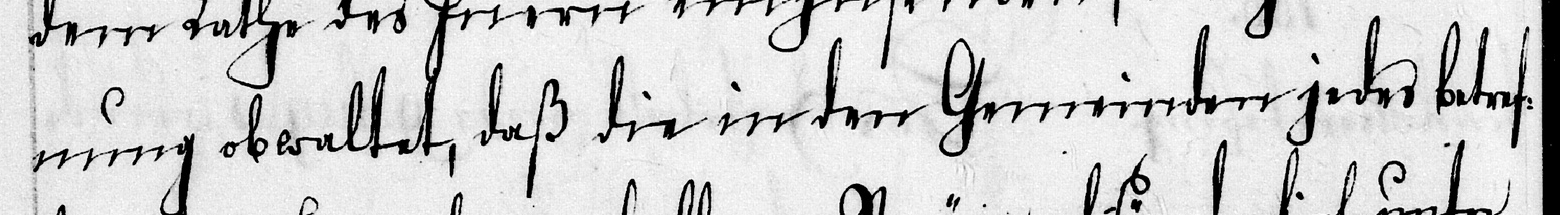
nung obwaltet, daß die in den Gemeinden jedes betref¬
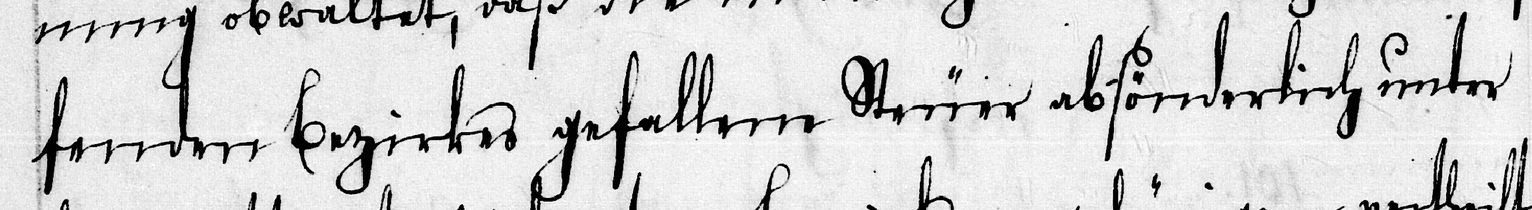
fenden Bezirkes gefallene Steuer absönderlich unter
